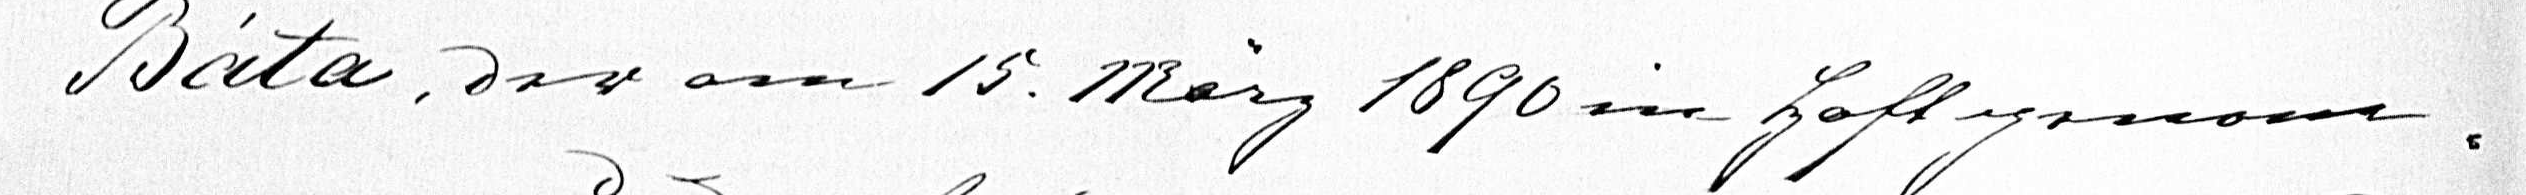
Báta, der am 15. März 1890 in Haft genom¬
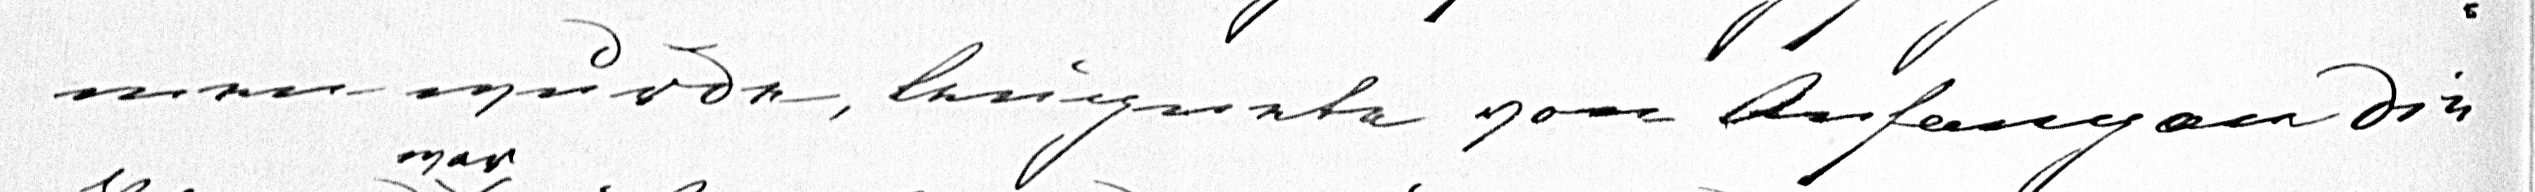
men wurde, leugnete von Anfangen die
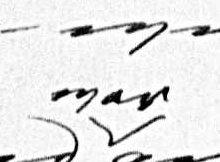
war
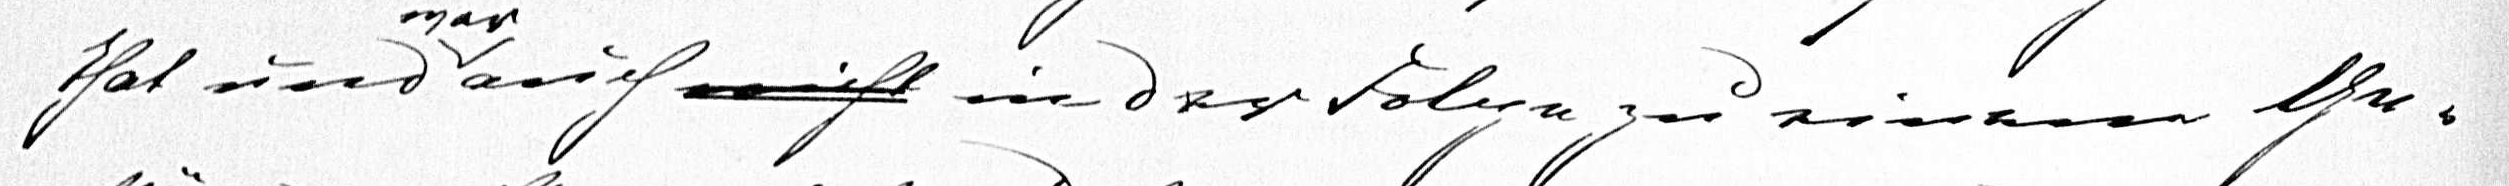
That und auch in der Folge zu einem Ge¬
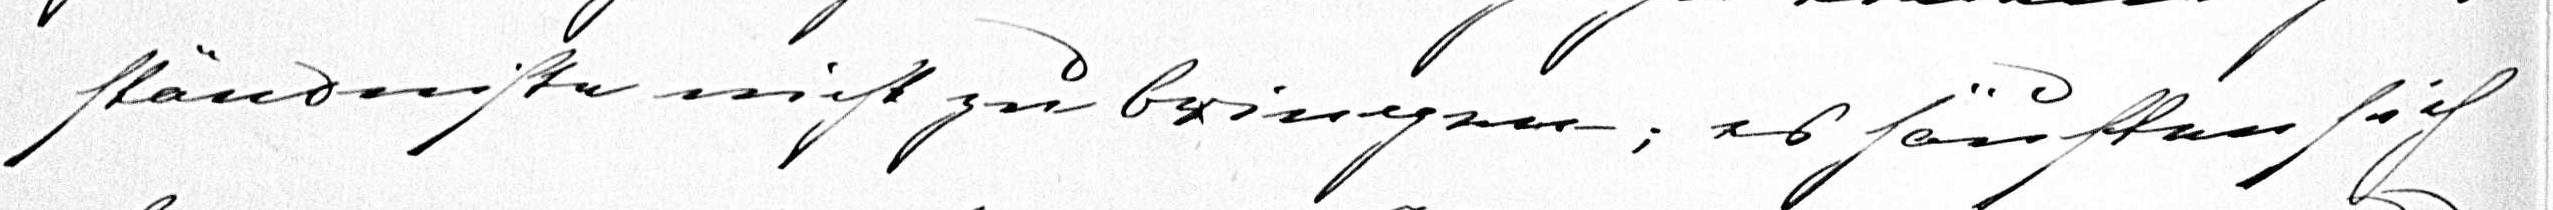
ständniße nicht zu bringen; es häuften sich
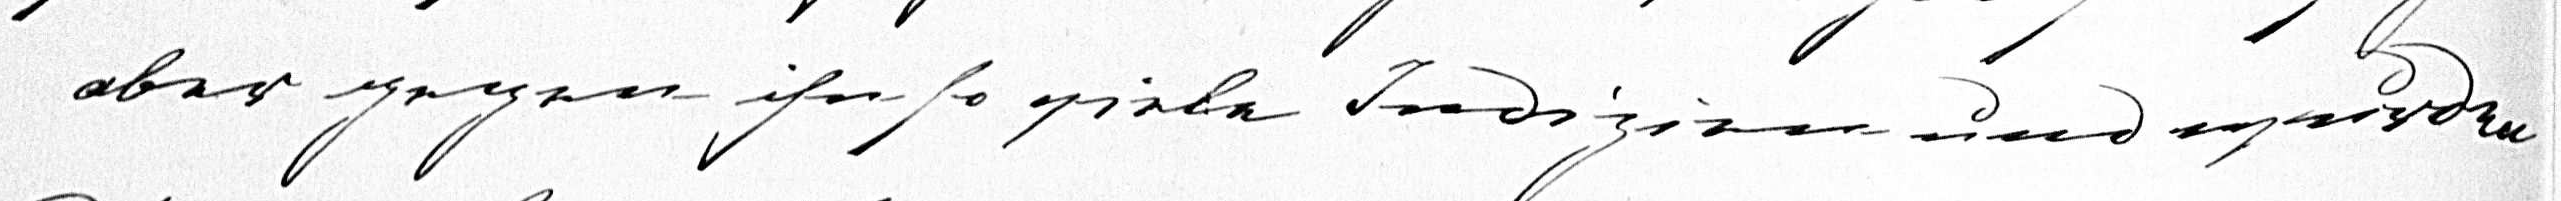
aber gegen ihn so viele Indizien und wurden
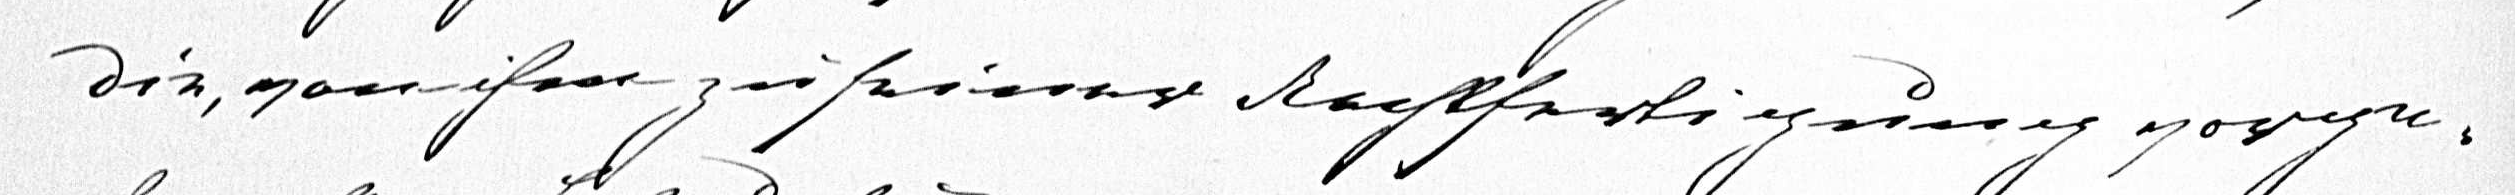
die, von ihm zuseiner Nachtfertigung vorge¬
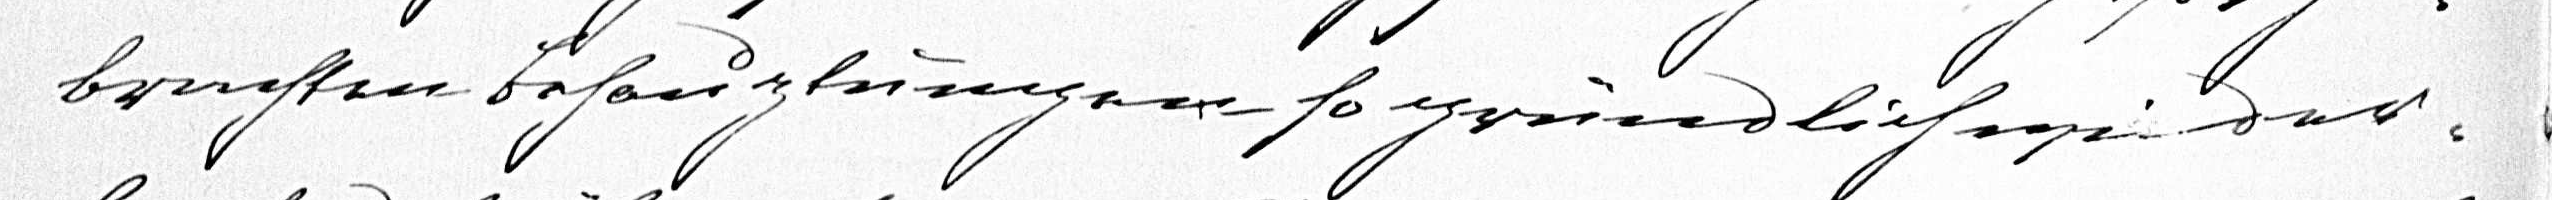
brachten Behandlungen so gründlich weider¬
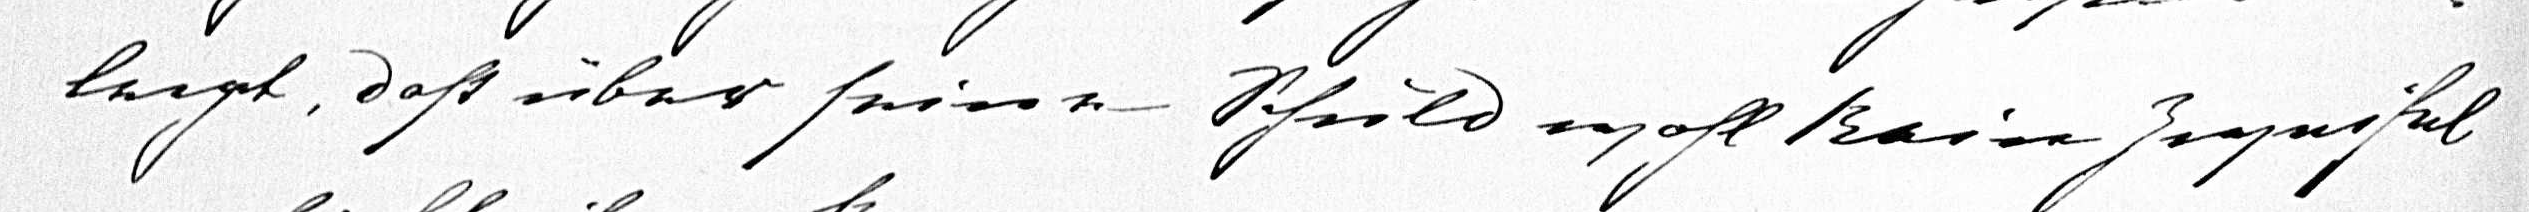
legt, daß über seine Schuld wohl kein Zweifel
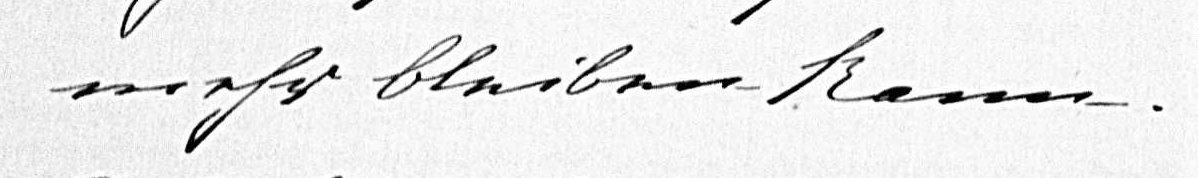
mehr bleiben kann.
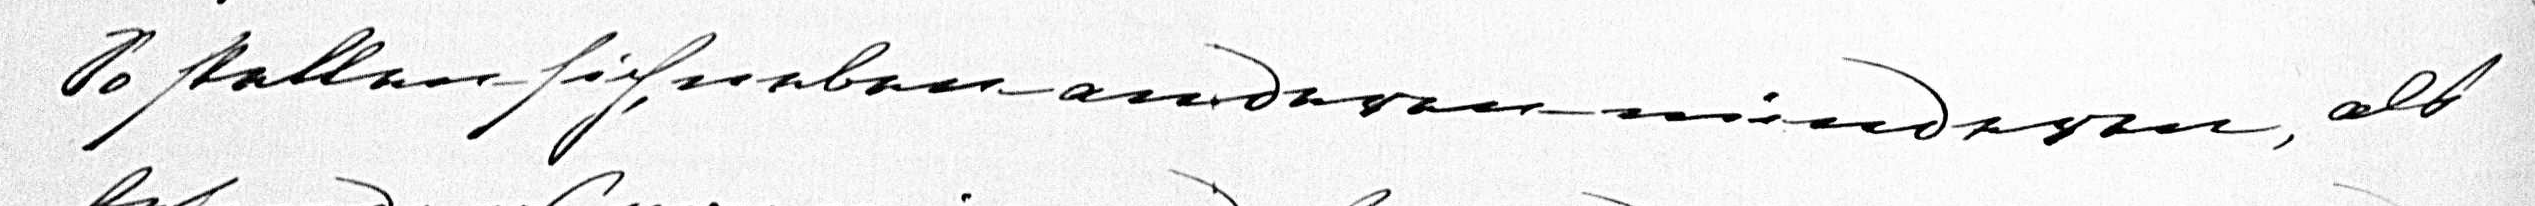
So stellen sich, neben anderen niederen, als
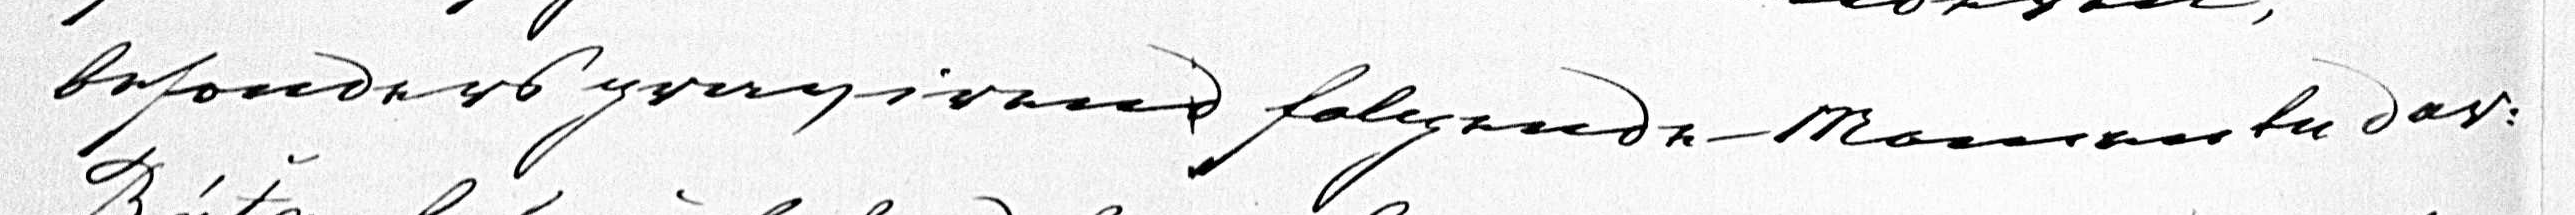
besonders gravirend folgende Momente dar:
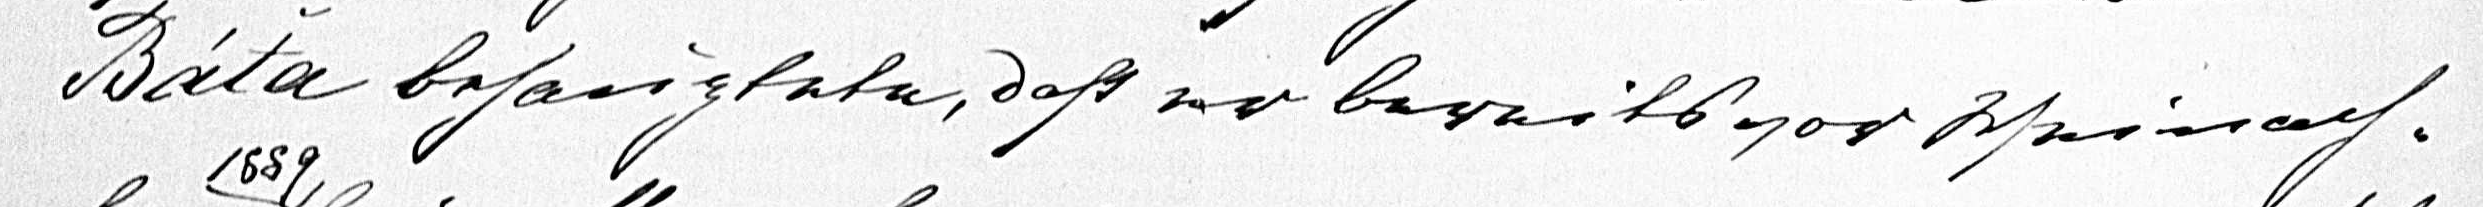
Báta behauptete, daß er bereits vor Weinach¬
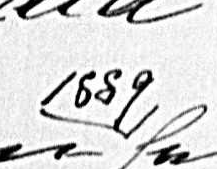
1889
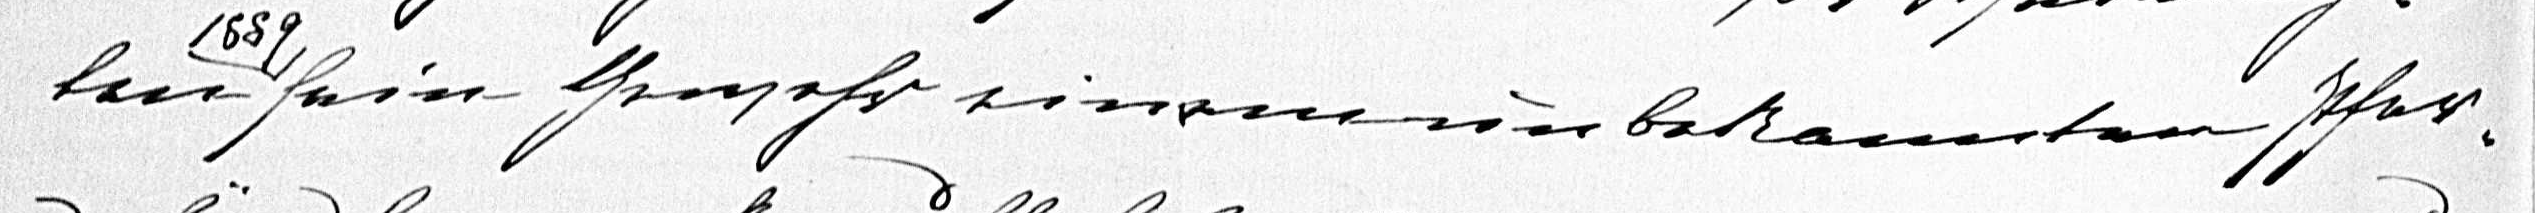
ten sein Gewehr einem unbekannten Pfer¬
